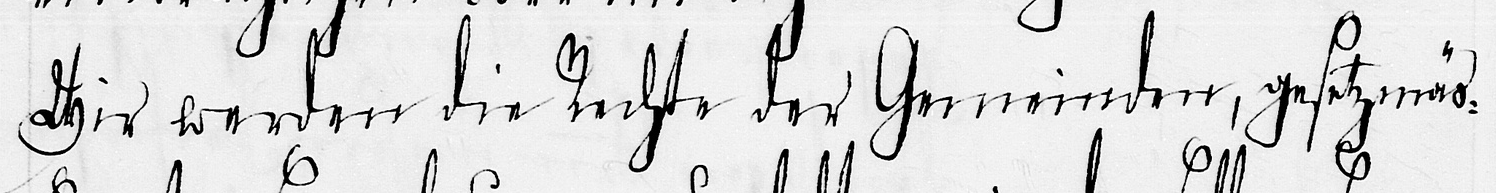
Wir werden die Rechte der Gemeinden, gesetzmäß¬
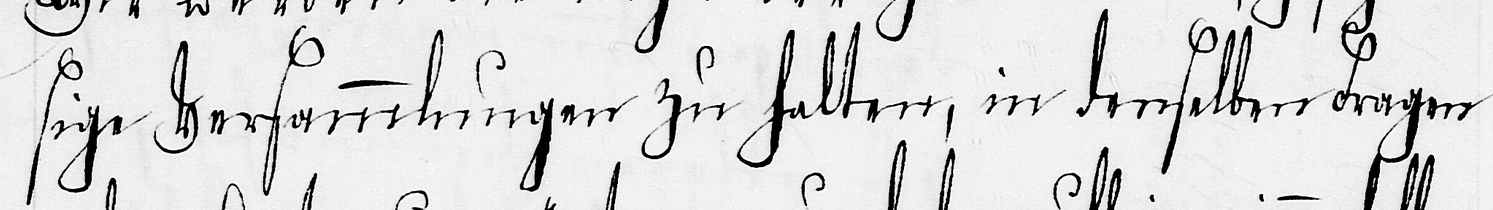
ige Versammlungen zu halten, in denselben Fragen
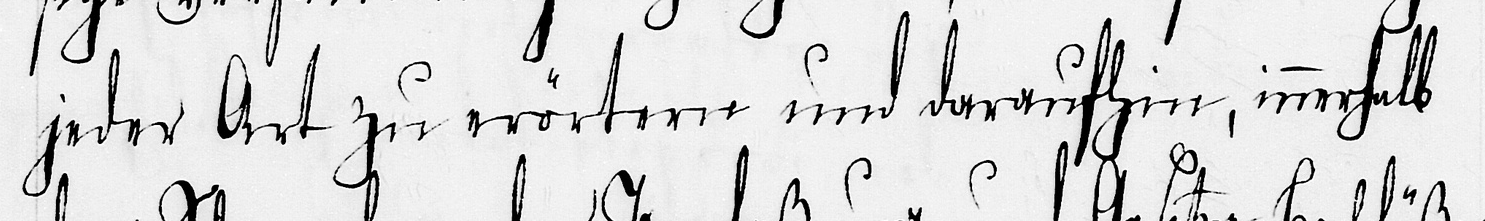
jeder Art zu erörtern und daraufhin, innerhalb
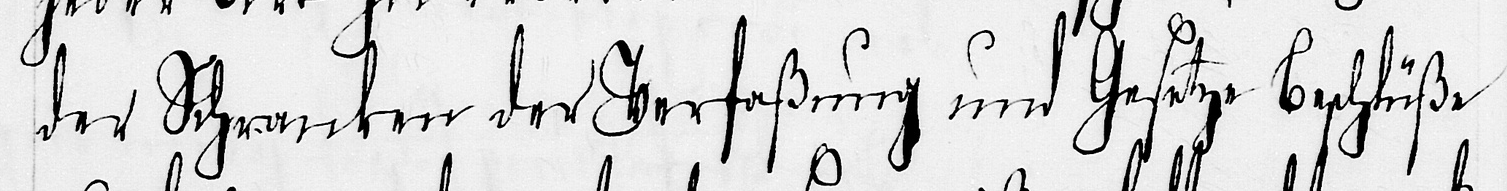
der Schranken der Verfaßung und Gesetze Beschlüße
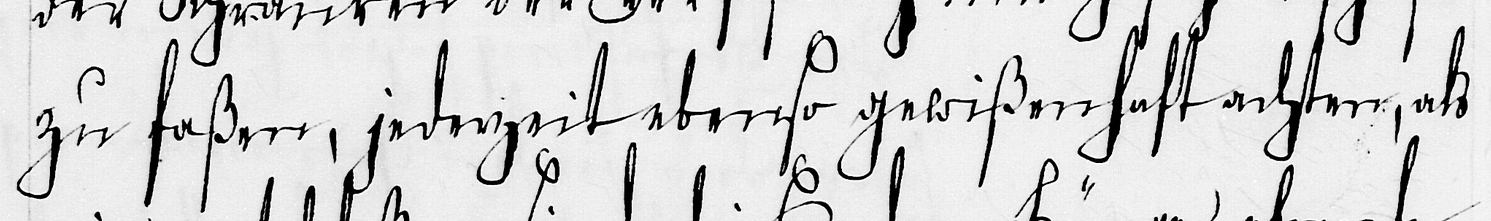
zu faßen, jederzeit ebenso gewißenhaft achten, als
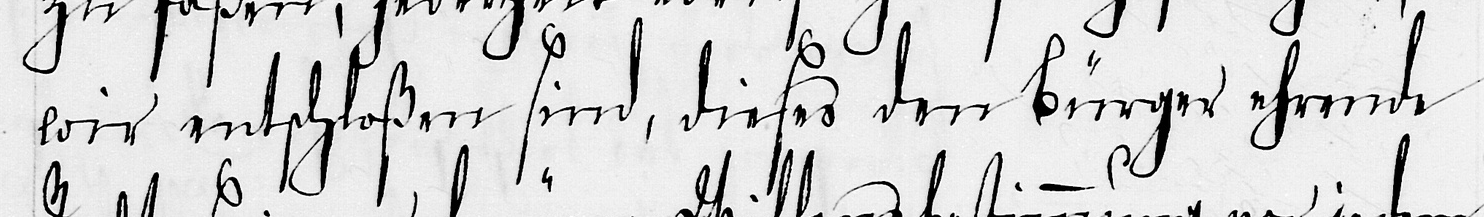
wir entschloßen sind, dieses den Bürger ehrende
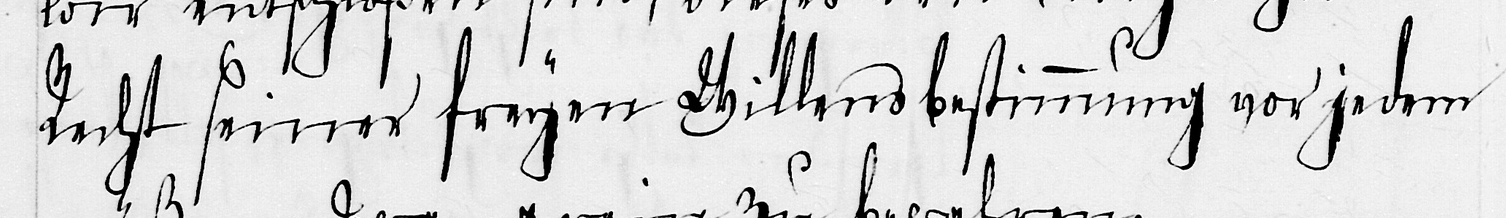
Recht seiner freyen Willensbestimmung vor jedem
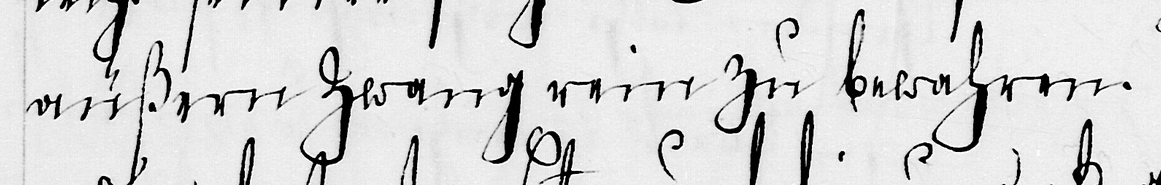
äußern Zwang rein zu bewahren.
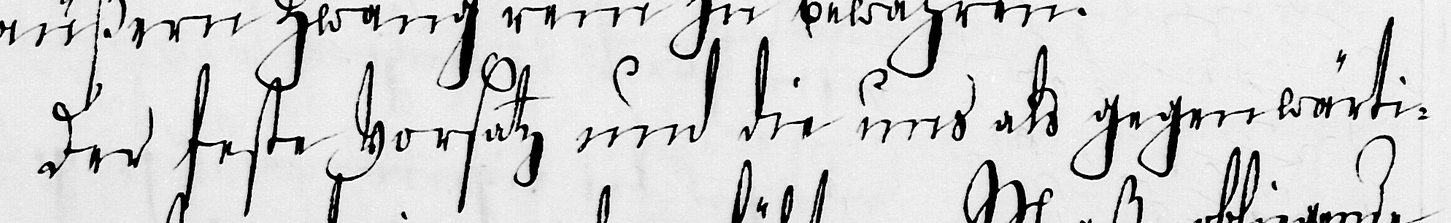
Der feste Vorsatz und die uns als gegenwärti¬
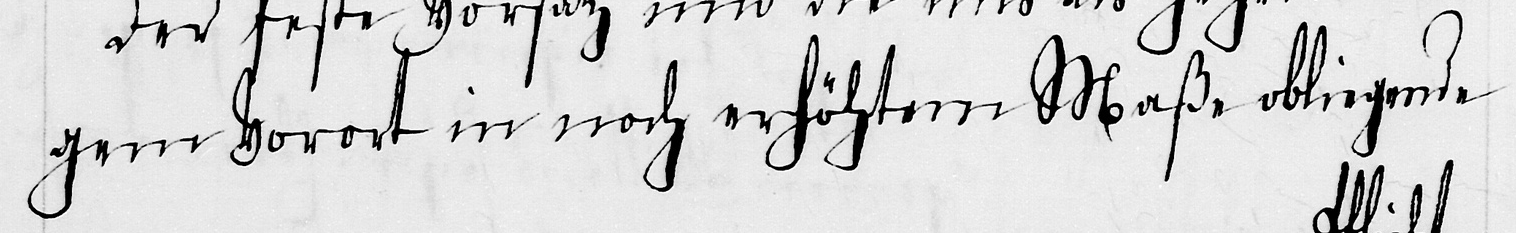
gem Vorort in noch erhöhtem Maße obliegende
